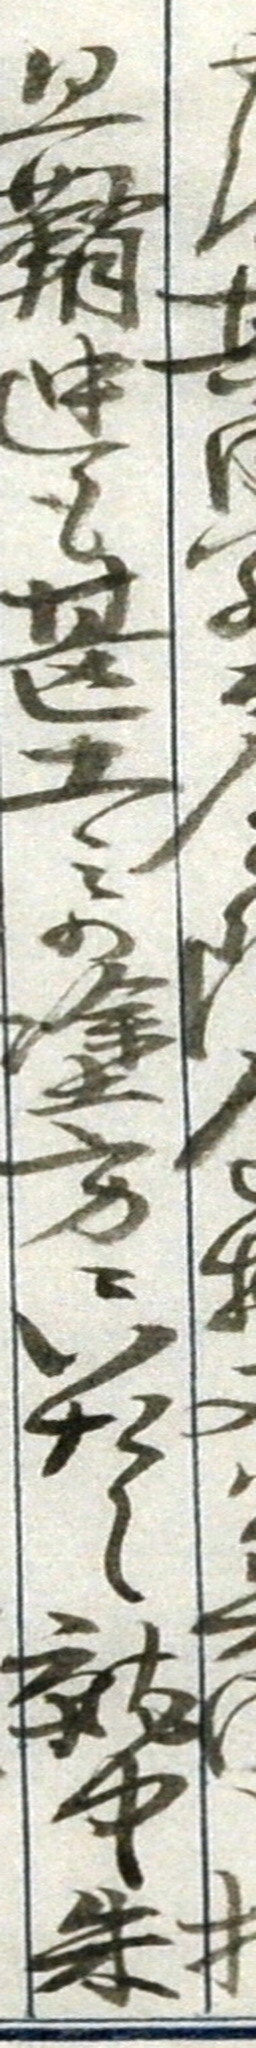且鞘迚も甚工ミ之塗方ニいたし就中朱
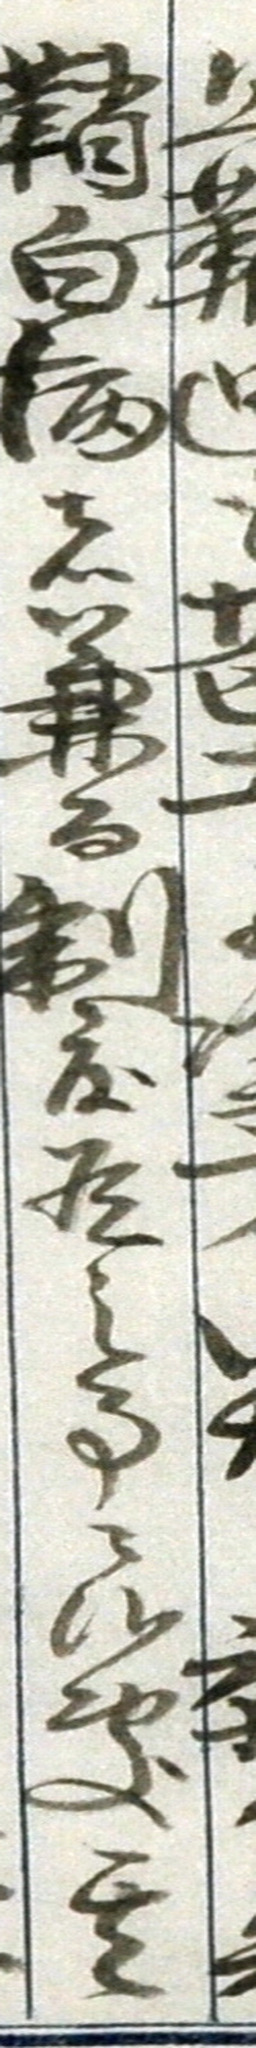鞘白柄は兼而制度有之事ニ候処其
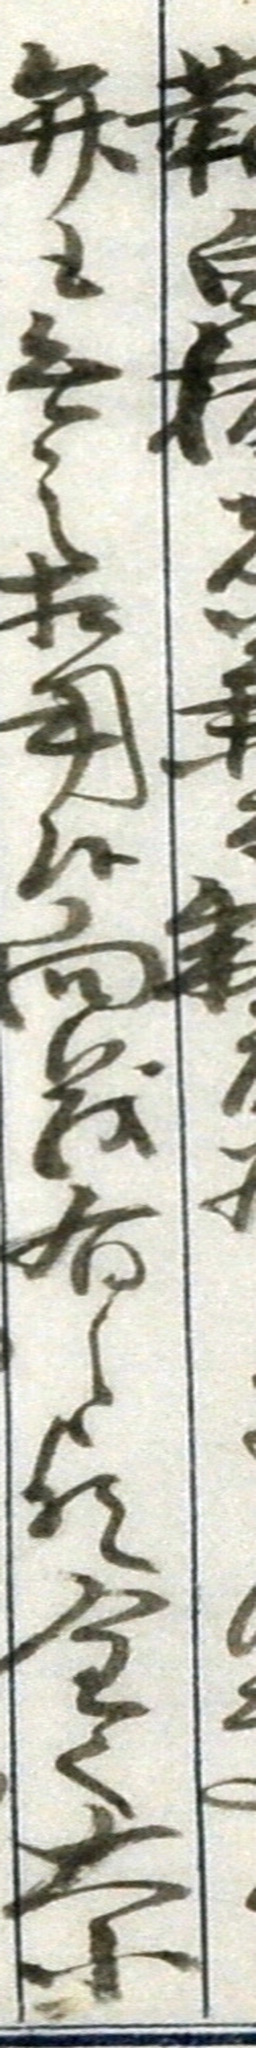弁も無之相用候向も有之候欤全く大小
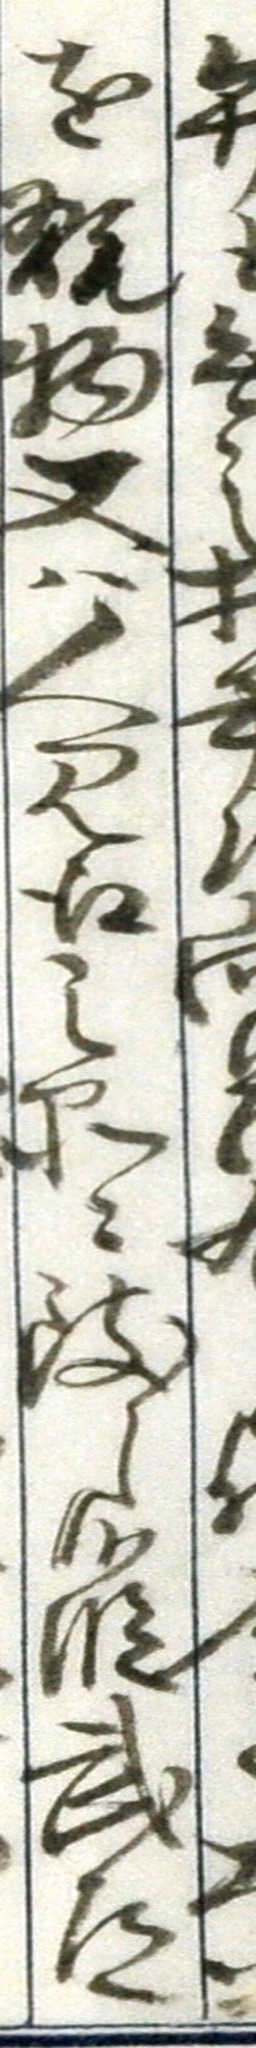を翫物又ハ人見得之品ニ致し候段武道
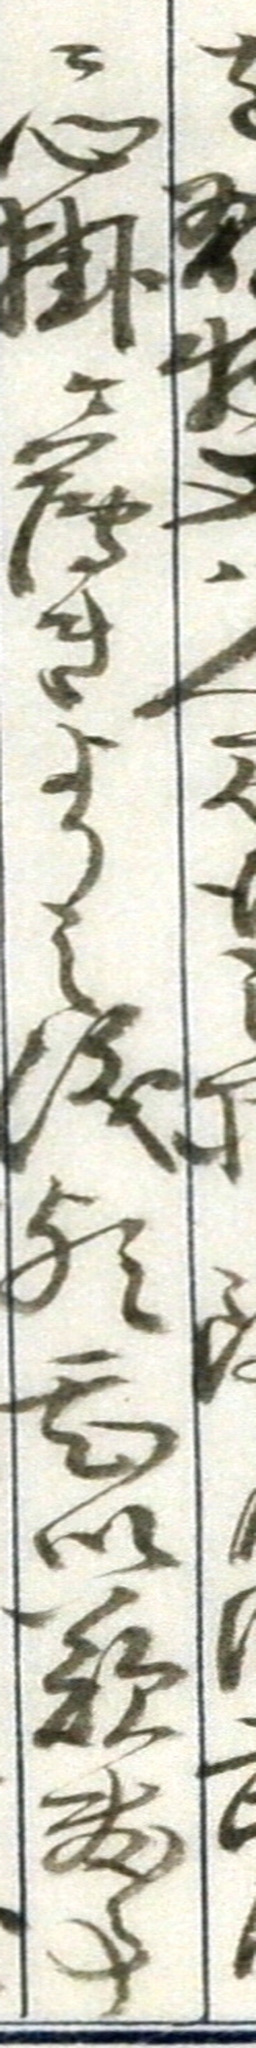ニ心掛ヶ薄きより之儀欤甚以歎敷事
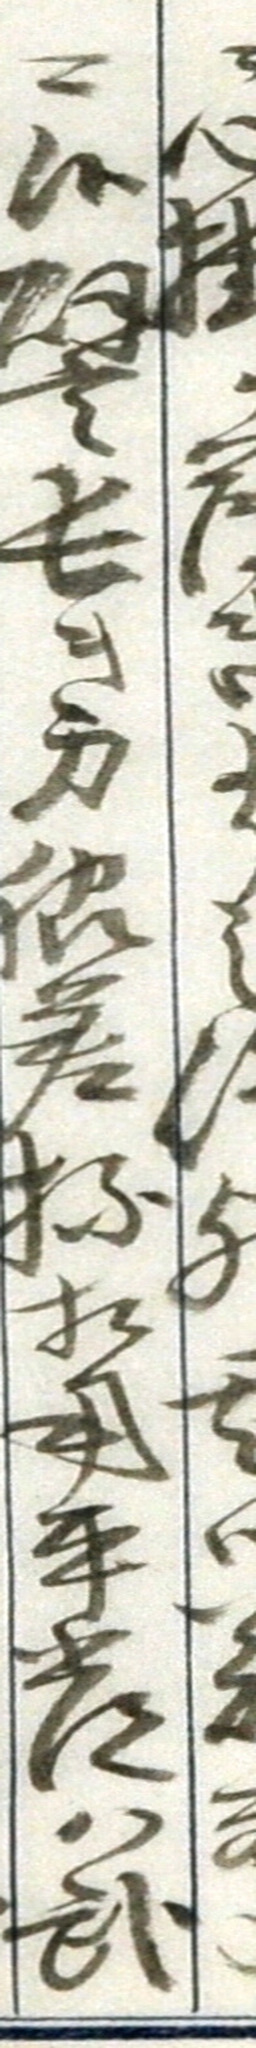ニ候譬長き刀脇差等相用平常ハ武
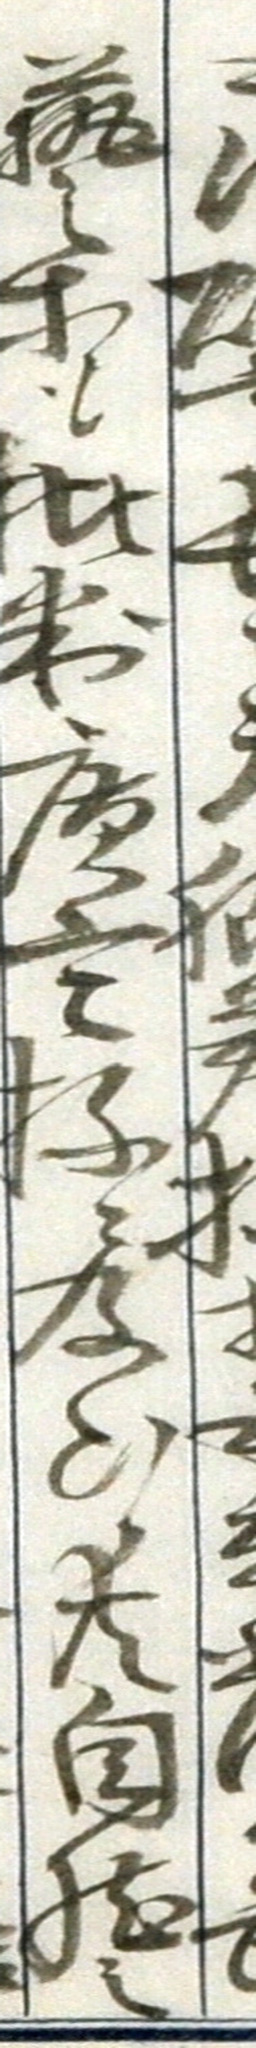芸等も批判広言抔ニ及ひ候共自然之
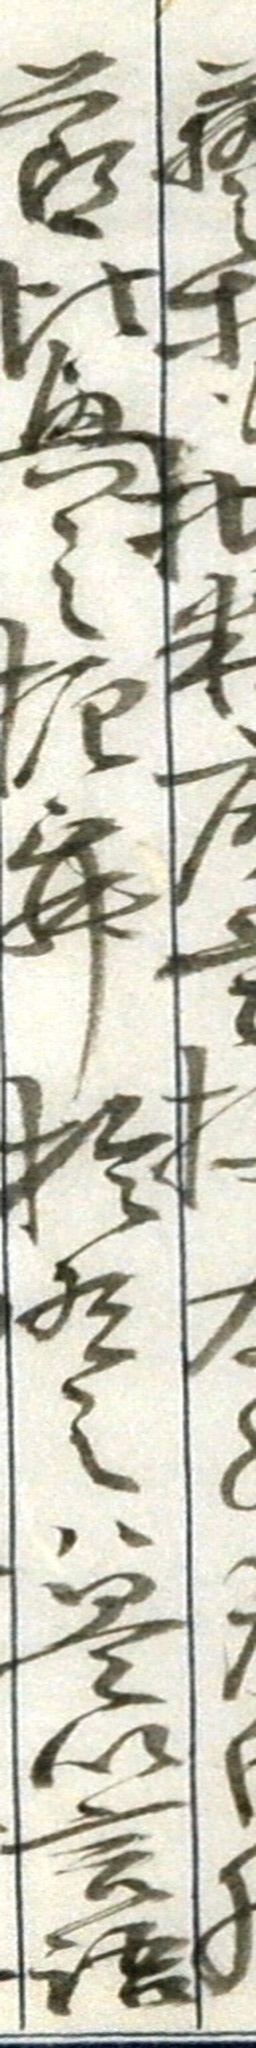節比興之振舞於有之ハ是以言語
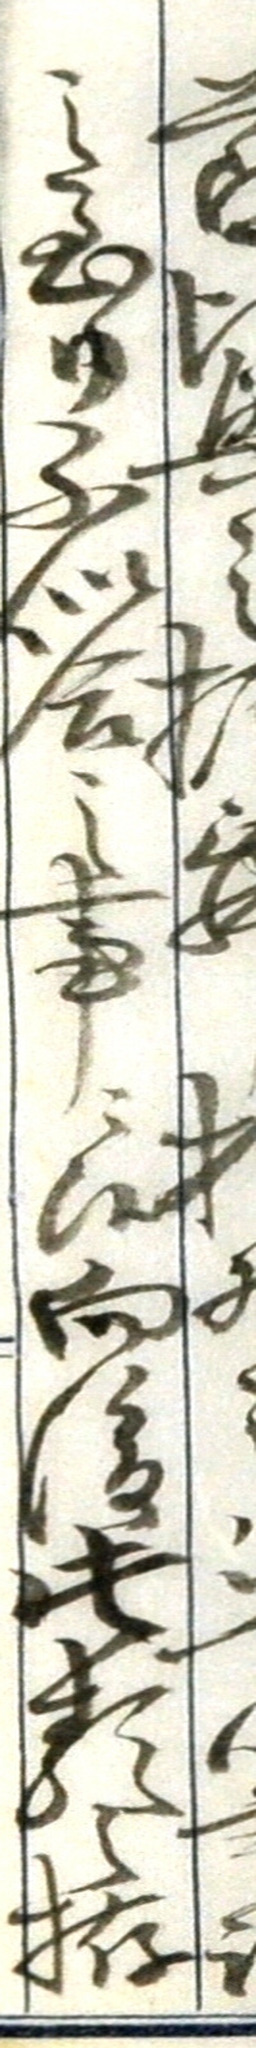之至り不似合之事ニ候向後此類之拵

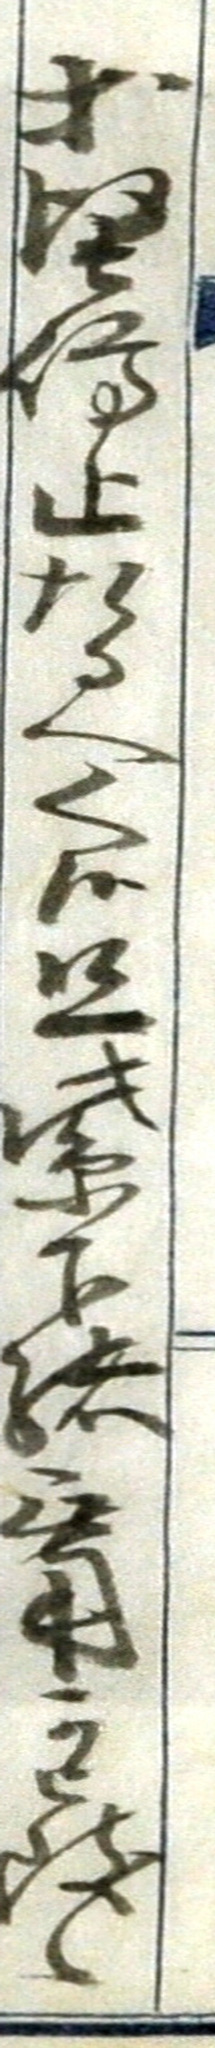等堅停止たるへく候且紫下緒無用可被致候
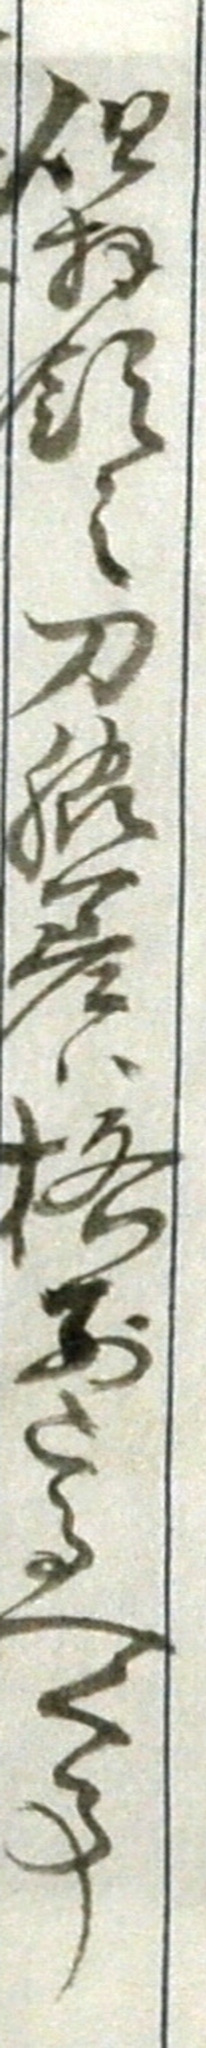但拝領之刀脇差ハ格別たるへく事
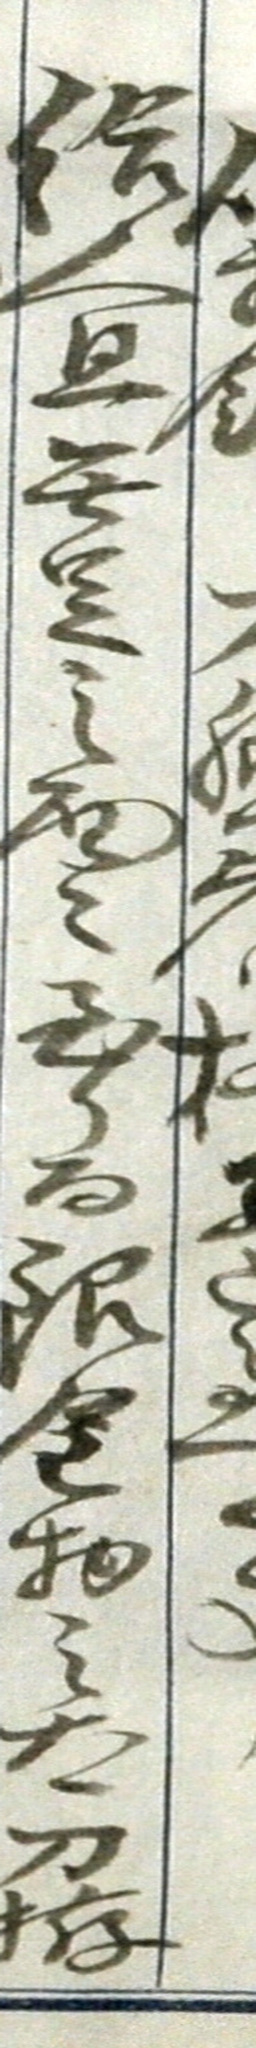一給人且無足之面々至り而銀金物之太刀拵
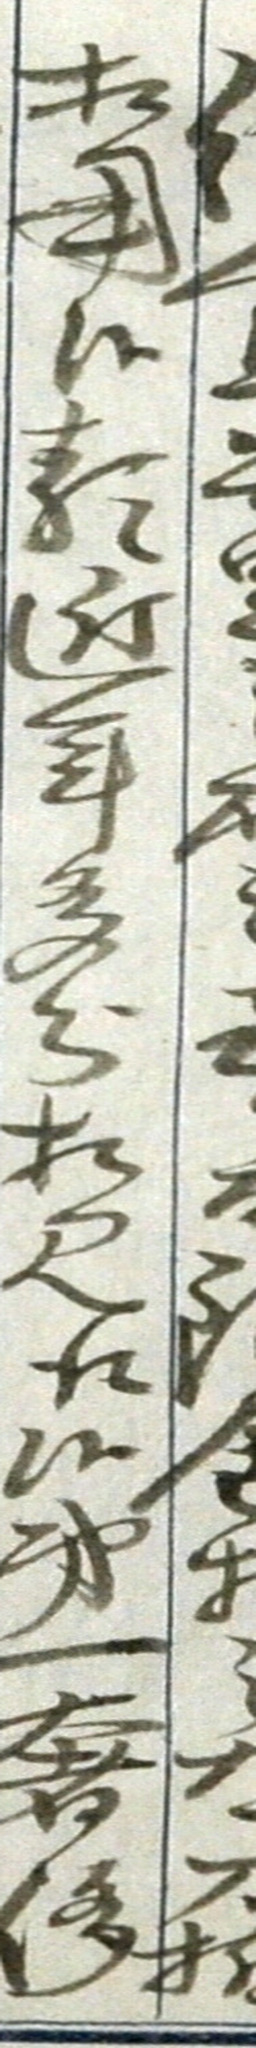相用候類近年多分相見え候第一奢侈
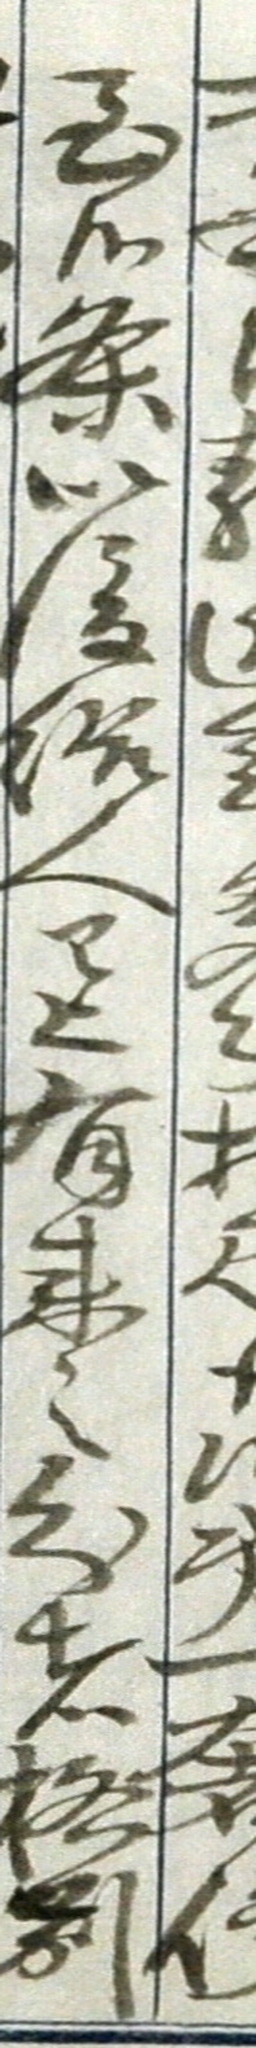至候条以後給人已上有来之分者格別
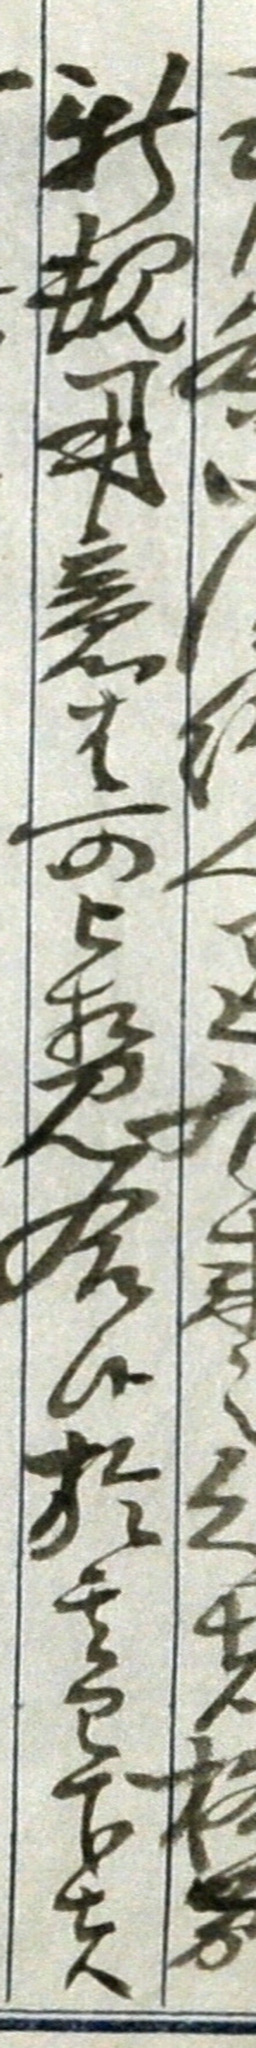新規用意は可被相見合候於其已下者
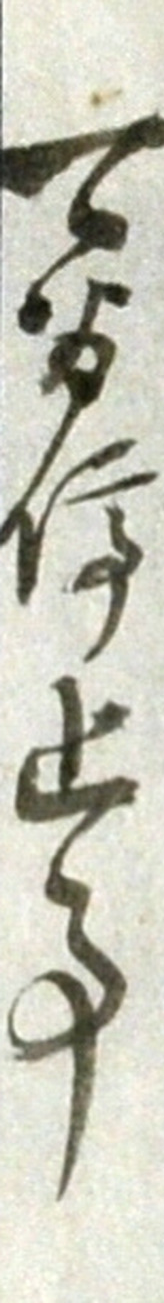可為停止事
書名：御倹約被仰出書
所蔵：伊那市立高遠町図書館・合同会社AMANE
